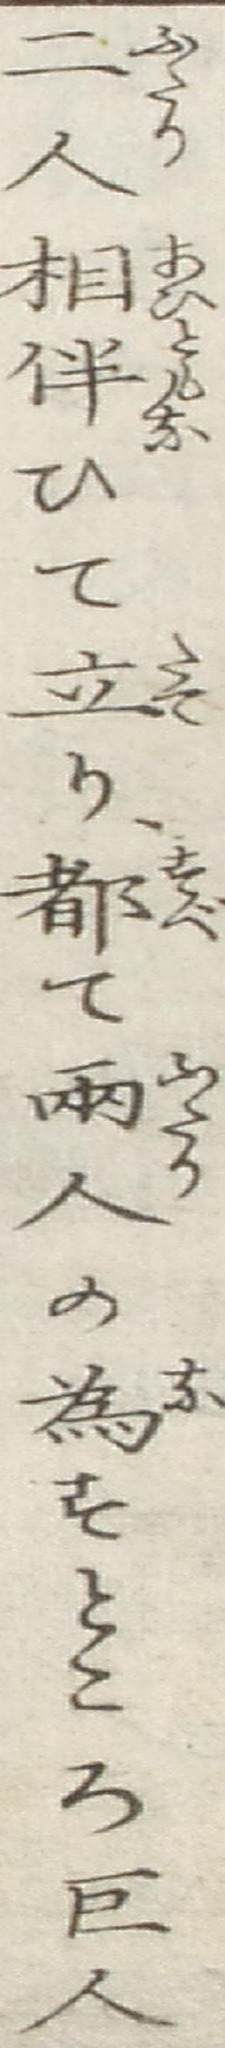二人相伴ひて立り、都て両人の為すところ巨人
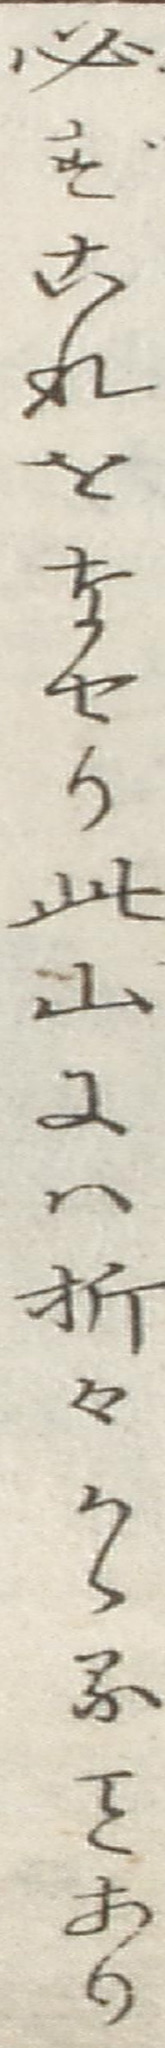必ずこれをなせり、此山には折々かゝることあり
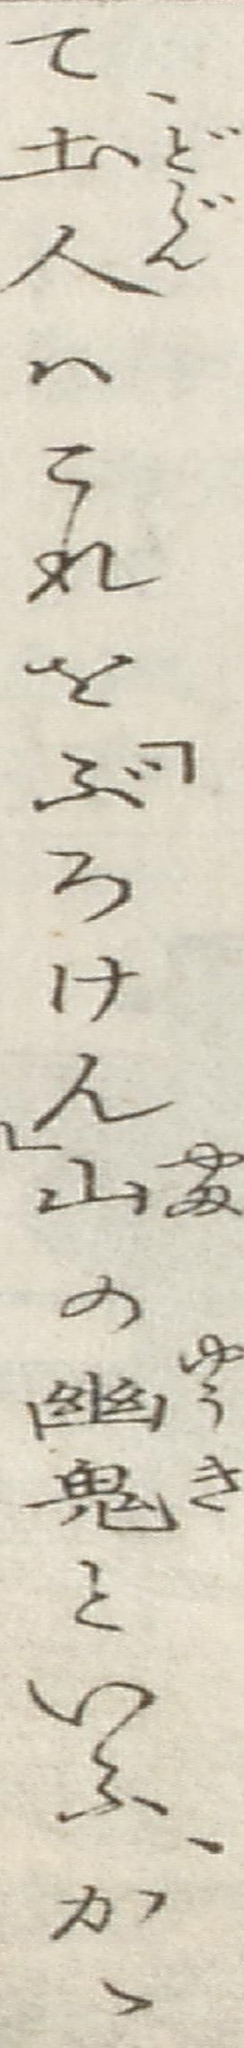て、土人はこれを「ぶろけん」山の幽鬼といふ、かゝ
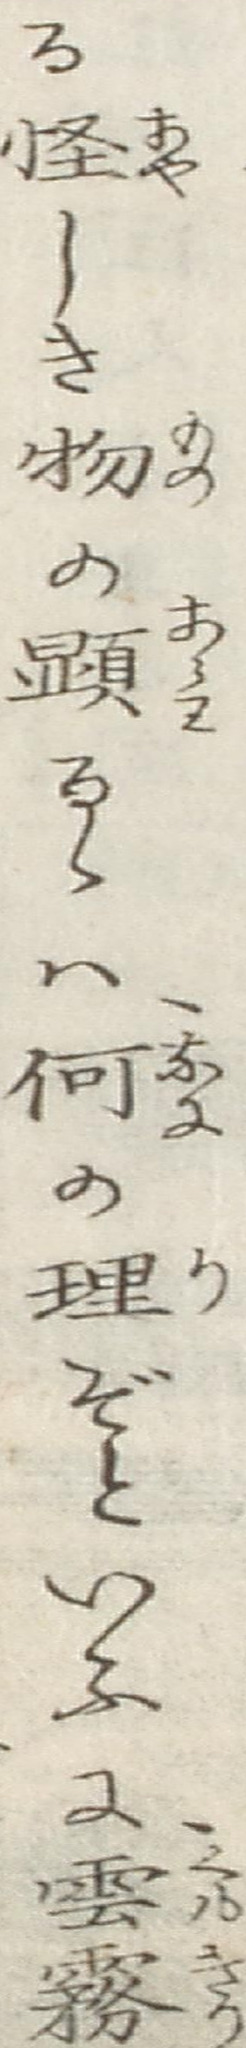る怪しき物の顕るゝは、何の理ぞといふに、雲霧
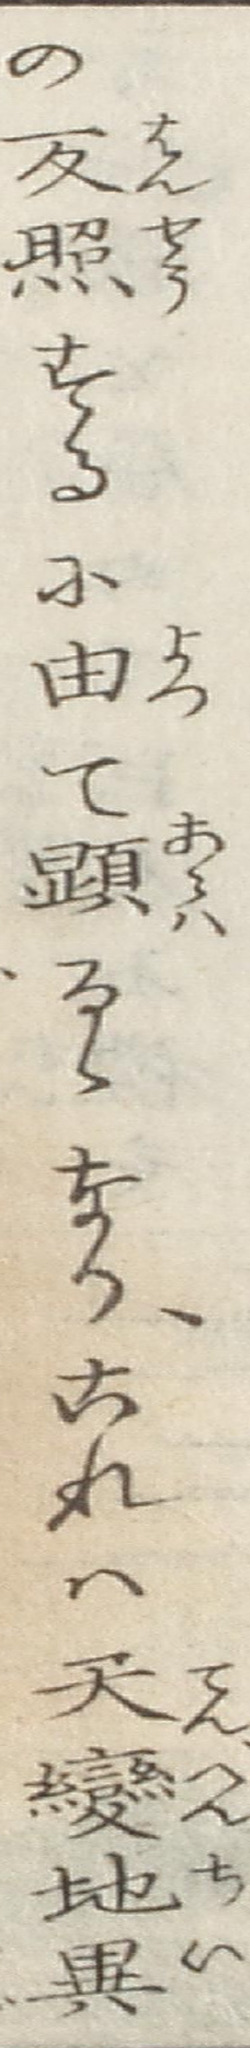の反照するに由て顕るゝなり、これは天変地異
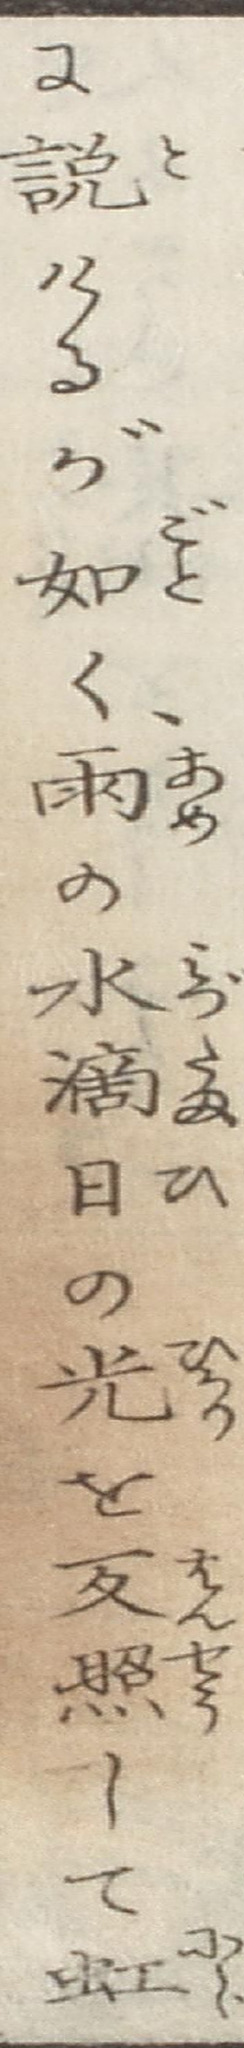に説けるが如く、雨の水滴日の光を反照して虹
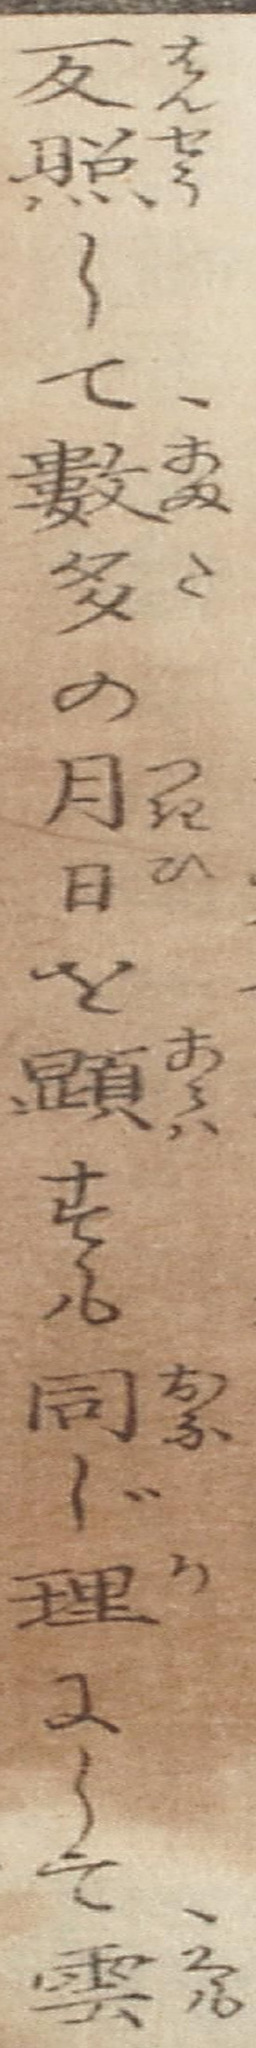反照して、数多の月日を顕すも同じ理にして、雲
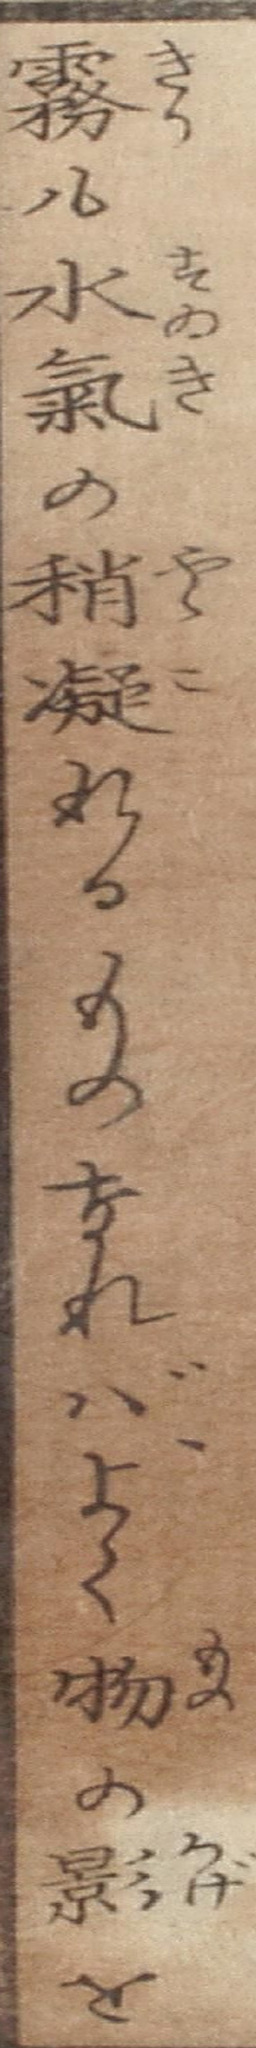霧も水気の稍凝れるものなれば、よく物の影を
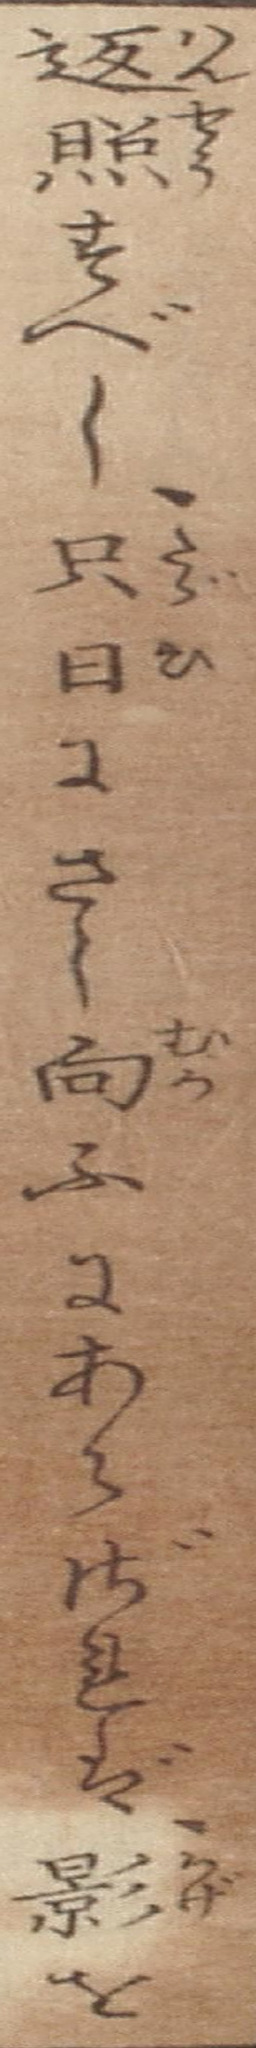返照すべし、只日のさし向ふにあらざれば、影を
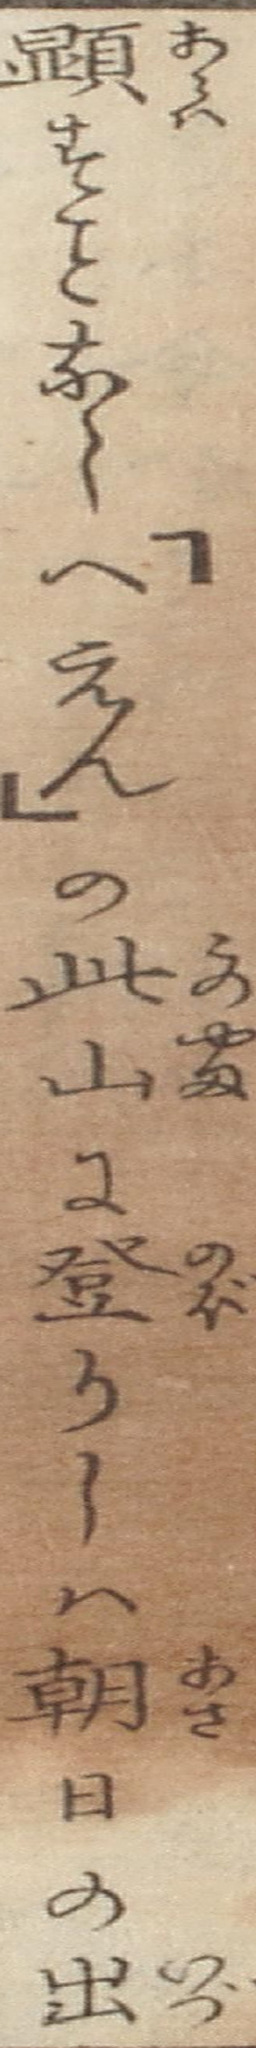顕すことなし「へえん」の此山に登りしは朝日の出
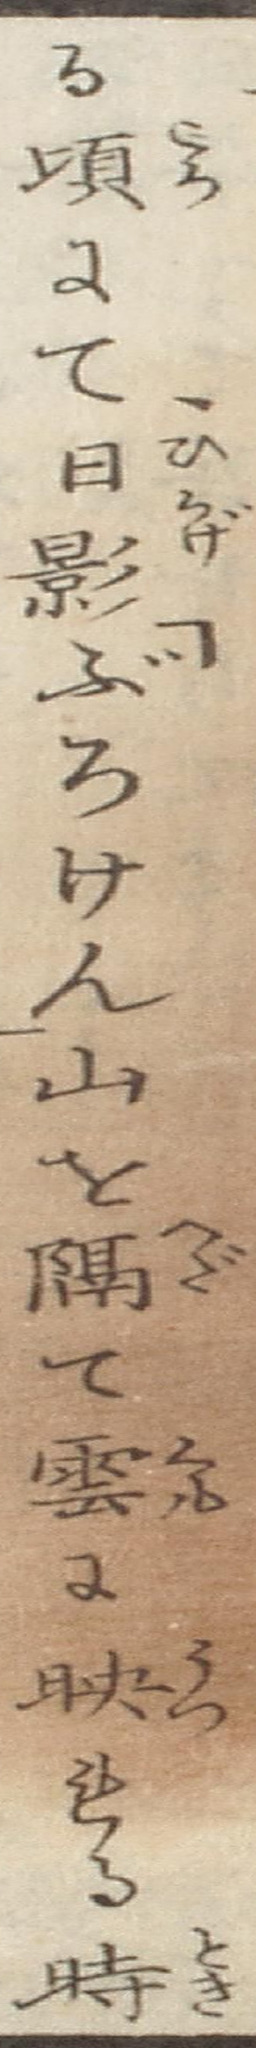る頃にて、日影「ぶろけん」山を隔て雲に映れる時
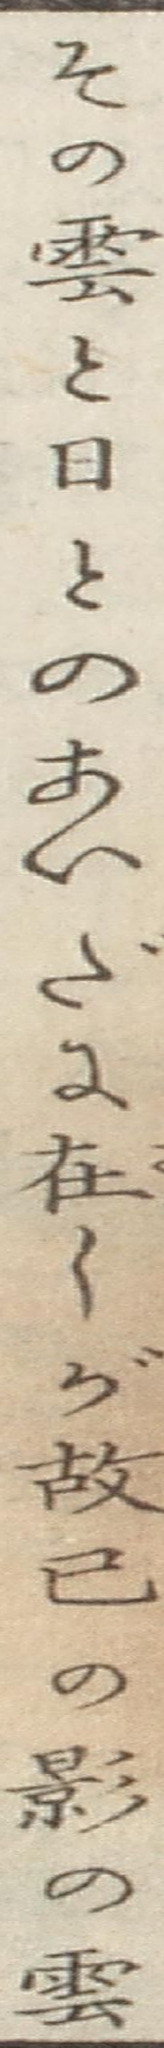その雲と日とのあいだに在しが故、己の影の雲
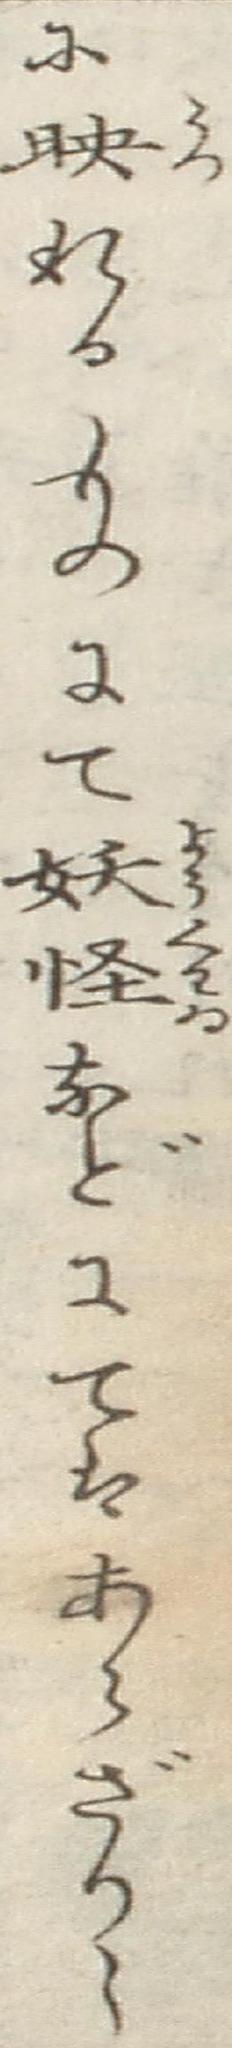に映れるものにて妖怪などにてはあらざりし
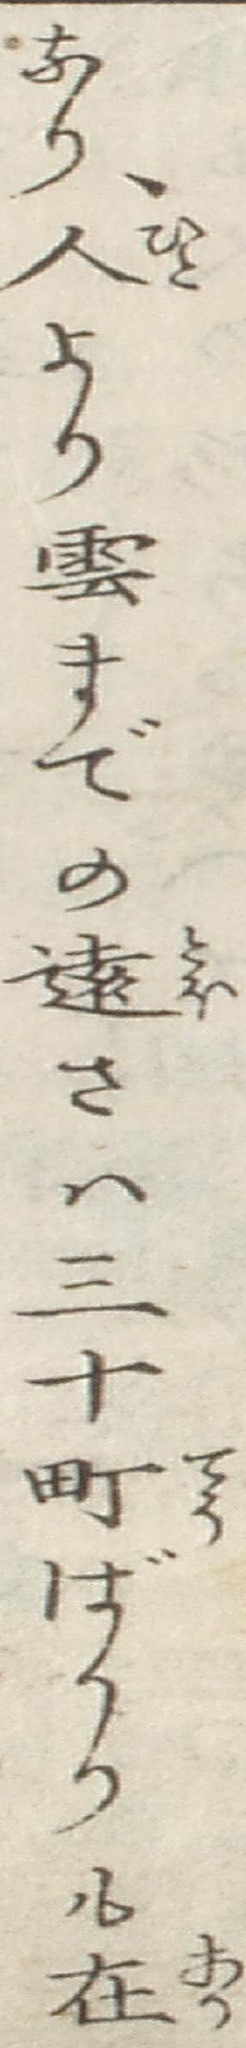なり、人より雲までの遠さは三十町ばかりも在
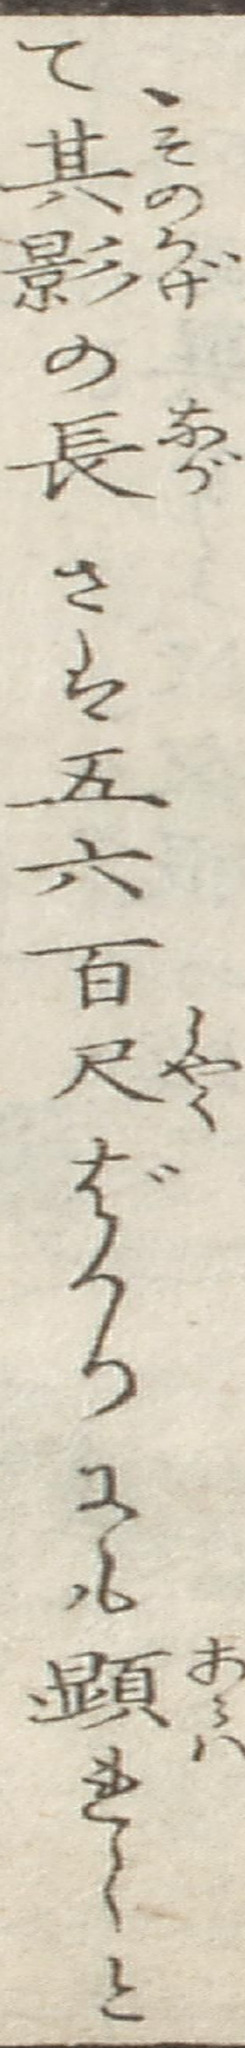て、其影の長さは五六百尺ばかりにも顕れしと
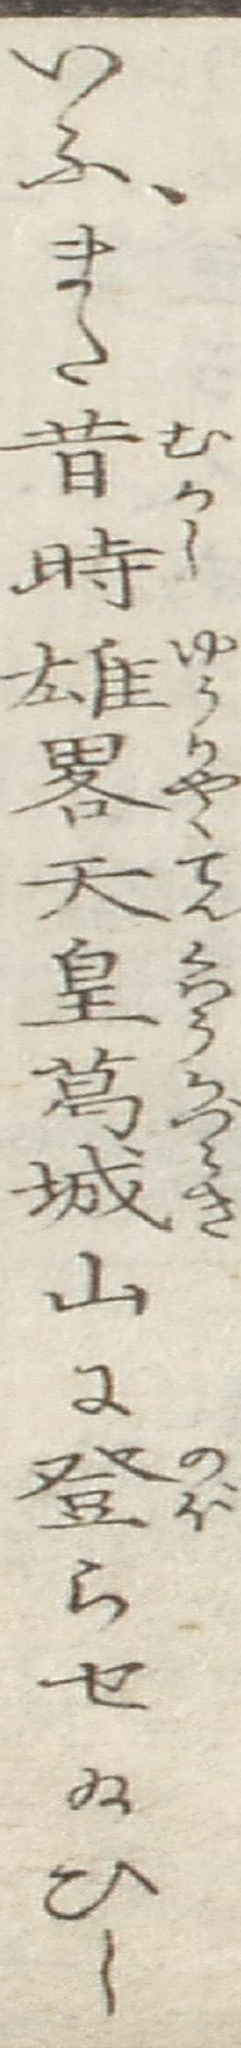いふ、また昔時雄略天皇葛城山に登らせ給ひし
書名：変異辯　一名、天變地異拾遺　全
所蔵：東京大学地震研究所図書室 Earthquake Research Institute Library, The University of Tokyo, JAPAN
